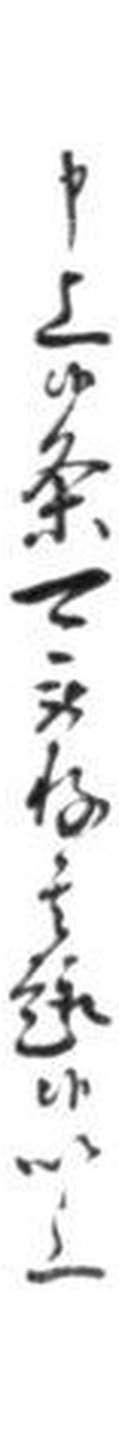申上候条可被存其趣候以上
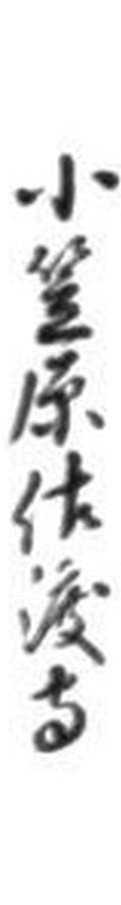小笠原佐渡守
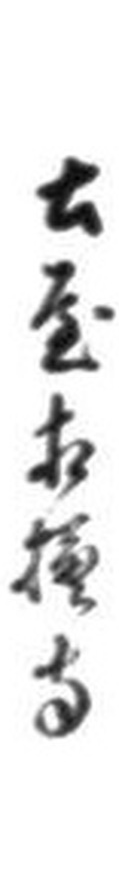土屋相模守
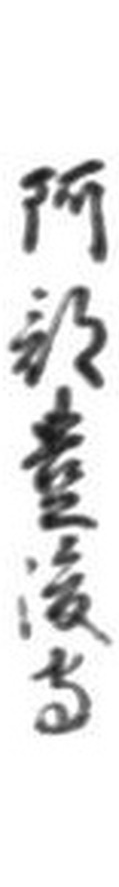阿部豊後守
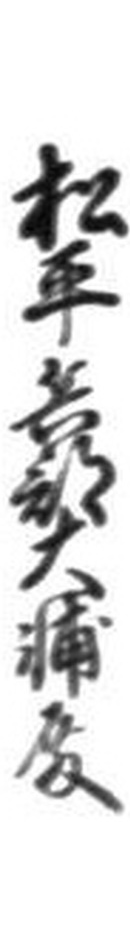松平兵部大輔殿
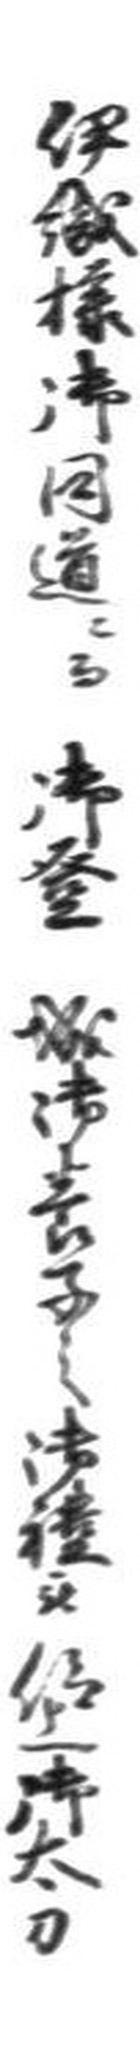伊織様御同道ニ而御登城御養子之御礼被仰上御太刀
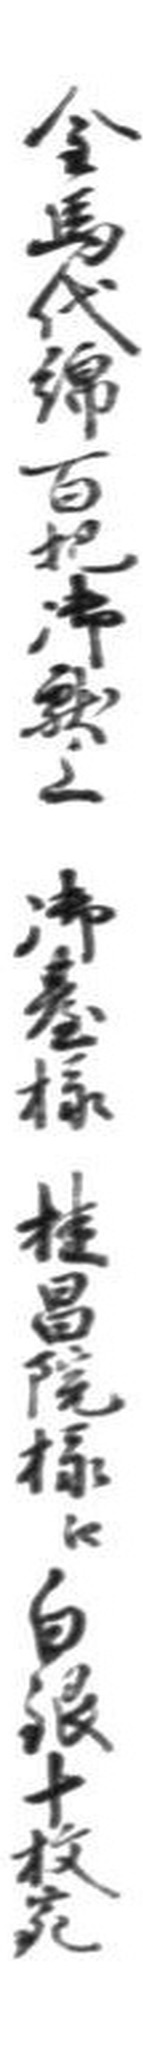金馬代綿百把御献上御台様桂昌院様江白銀十枚宛御機嫌

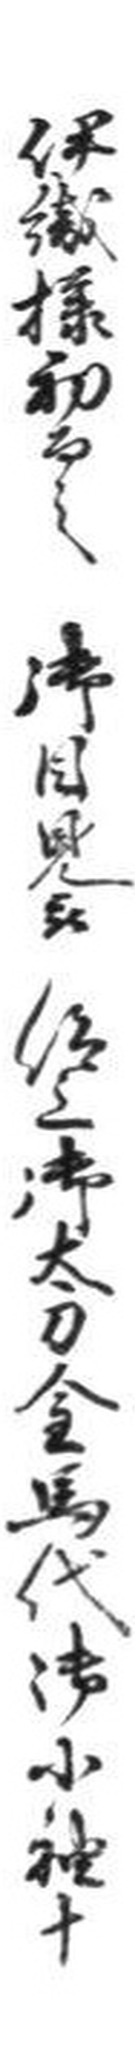伊織様初而之御目見被仰上御太刀金馬代御小袖十
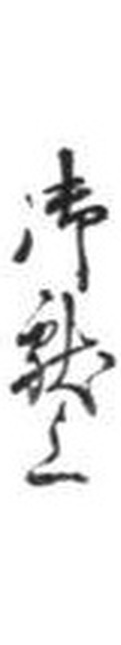御献上
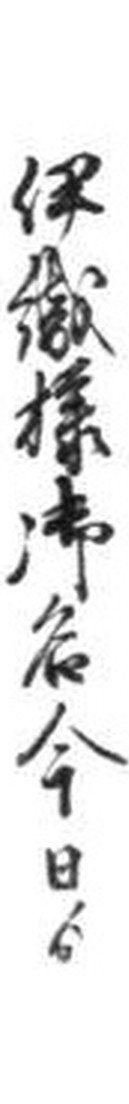伊織様御名今日ゟ
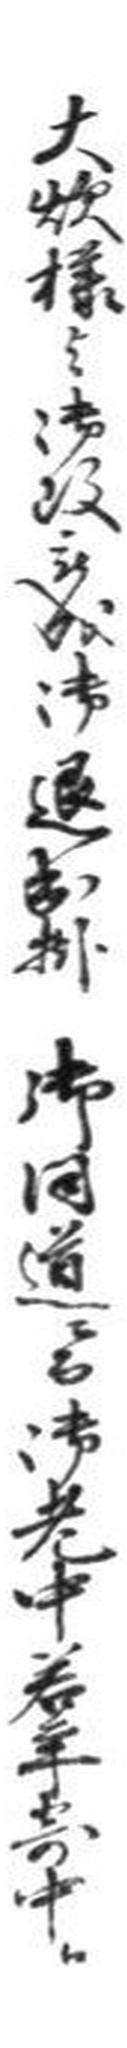大炊様与御改被成御退出掛御同道ニ而御老中若年寄中江
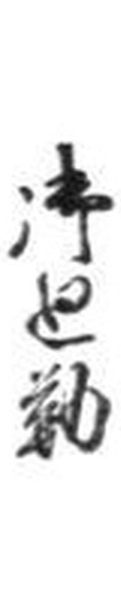御廻勤
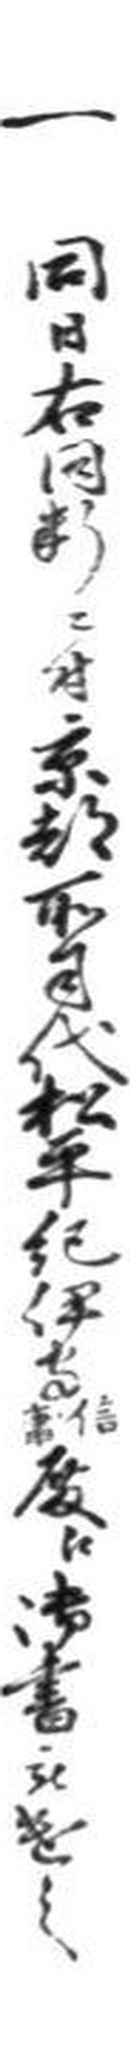一同日右同断ニ付京都所司代松平紀伊守信康殿江御書被遣之
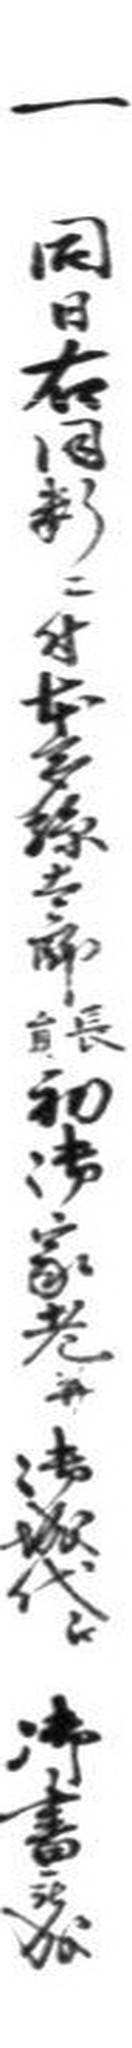一同日右同断ニ付本多孫太郎長員初御家老幷御城代江御書被成
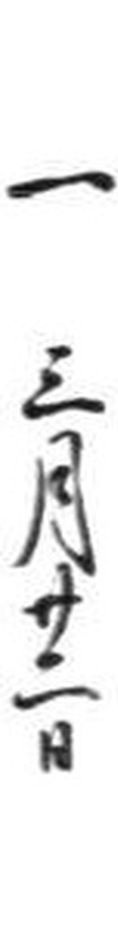一三月廿二日
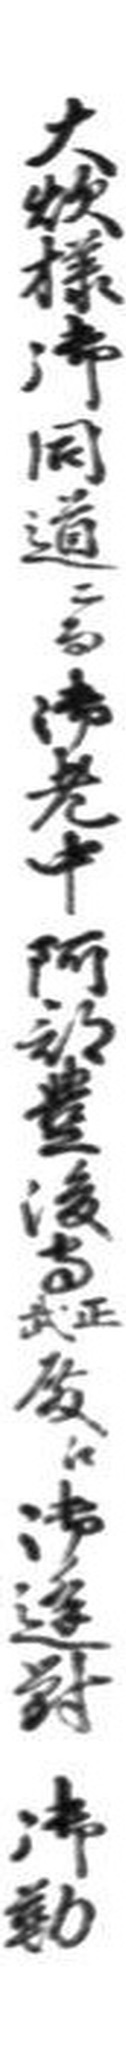大炊様御同道ニ而御老中阿部豊後守正武殿江御逢対御勤
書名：家譜 二十一 吉品公 従元禄十三年到同十四年
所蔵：福井県文書館 Fukui Prefectural Archives
